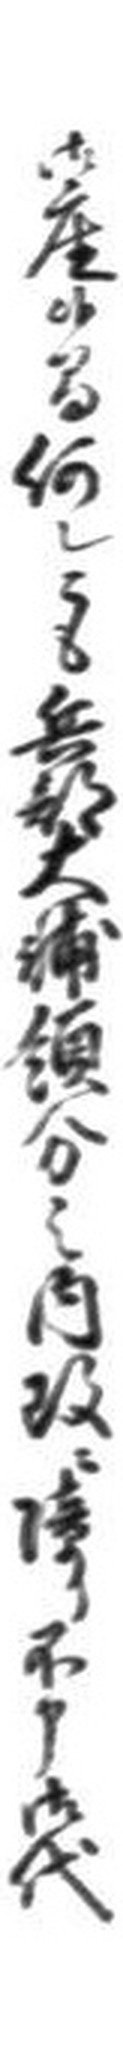御座候間何レニも兵部大輔領分之内改ニ障り不申御代
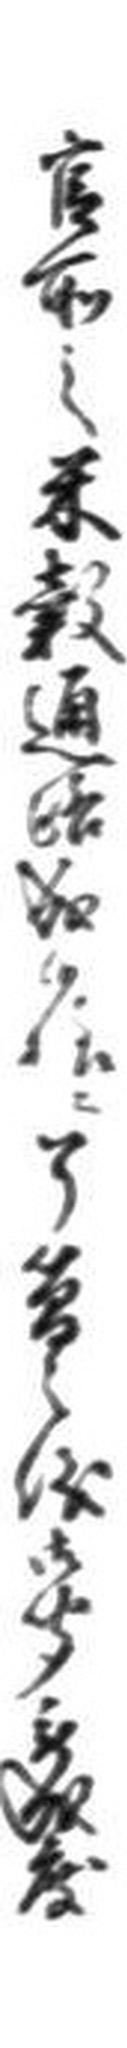官所之米穀通路成候様ニ了簡之儀御聞被成度
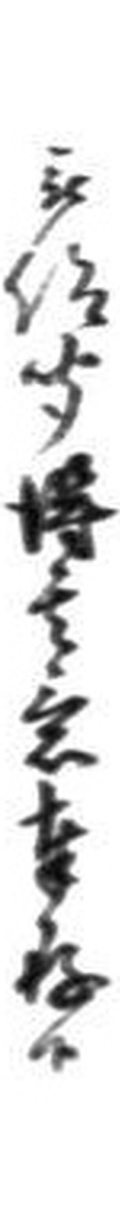被仰聞得其意奉存候
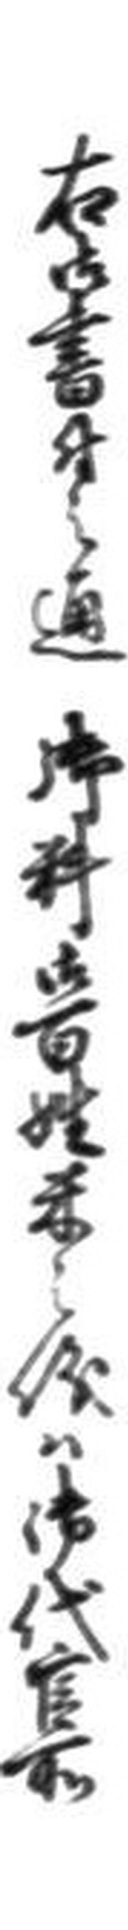右御書付之通御料御百姓米之儀ハ御代官所
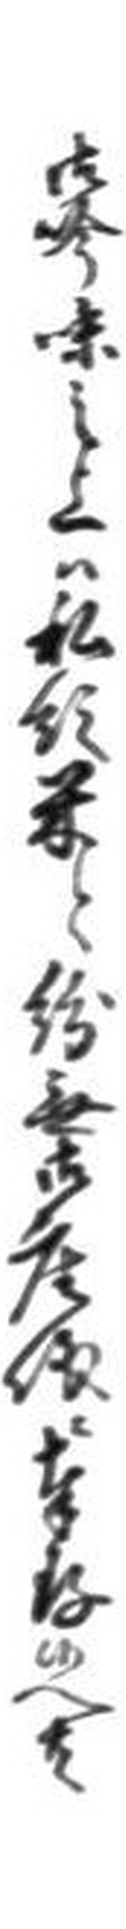御吟味之上ハ私領米と紛無御座儀ニ奉存候へ共
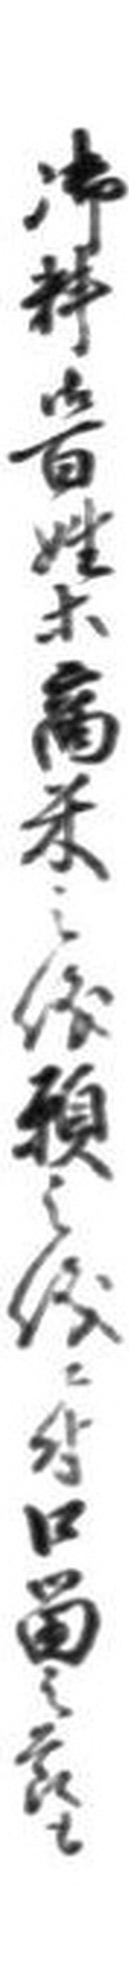御料御百姓等商米之儀願之儀ニ付口留之節も

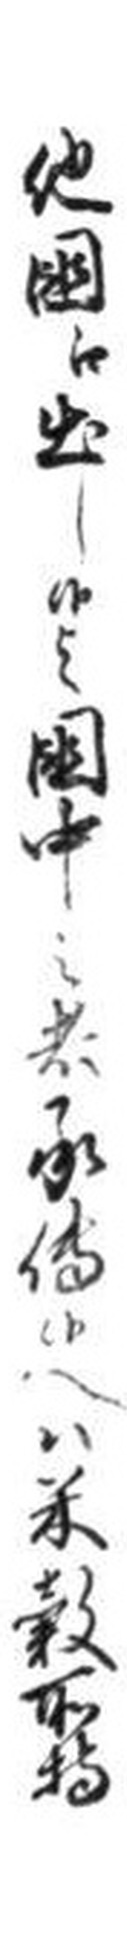他国江出し候与国中之者承伝候ヘハ米穀所持
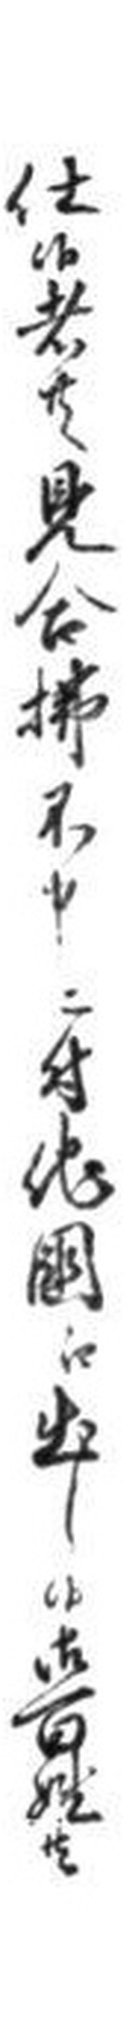仕候者共見合払不申ニ付他国江出し候御百姓共
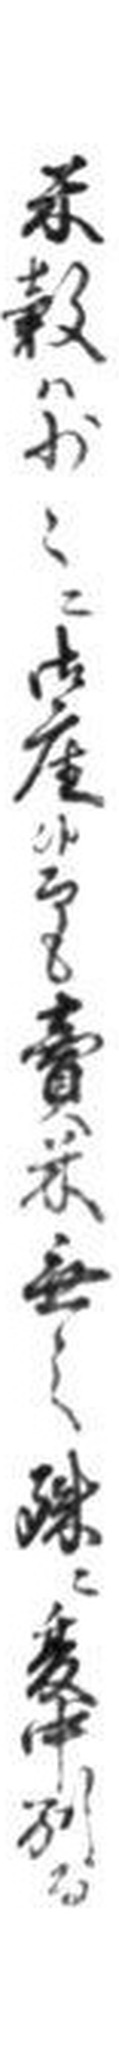米穀ハ少々ニ御座候而も売米無之殊ニ夏中別而
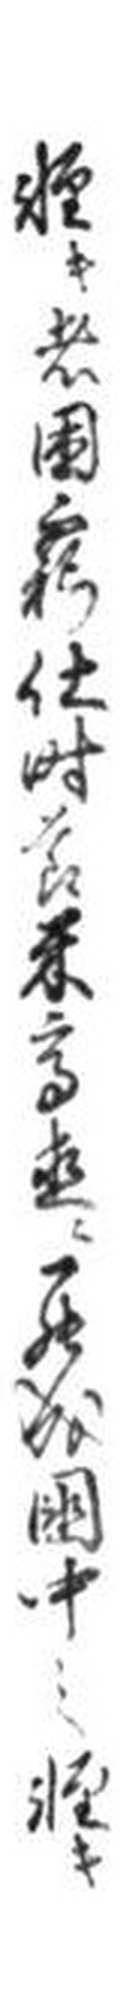軽キ者困窮仕時節米高直ニ罷成国中之軽キ
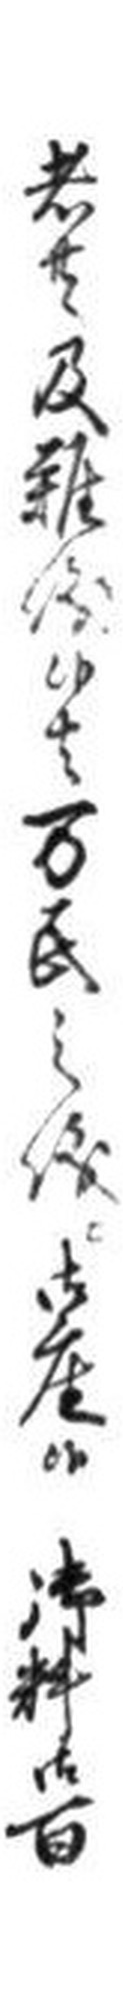者共及難儀候者万民之儀ニ御座候御料御百
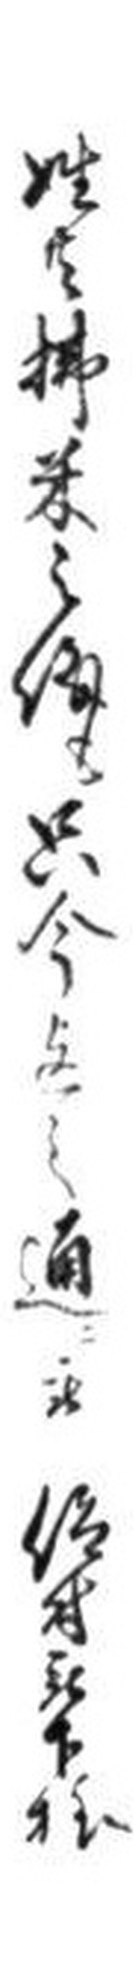姓共払米之儀も只今迄之通ニ被仰付被下様
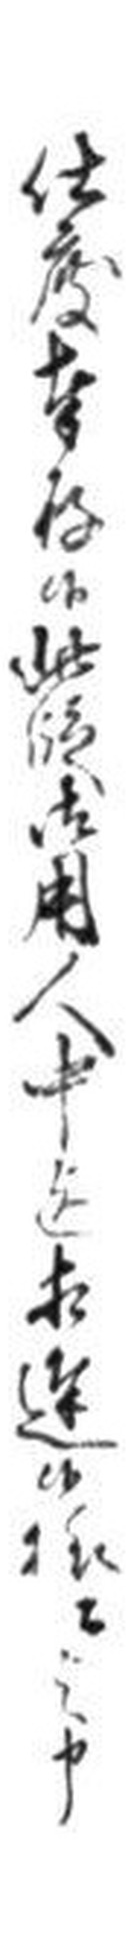仕度奉存候此段御用人中迄相達候様ニ与申
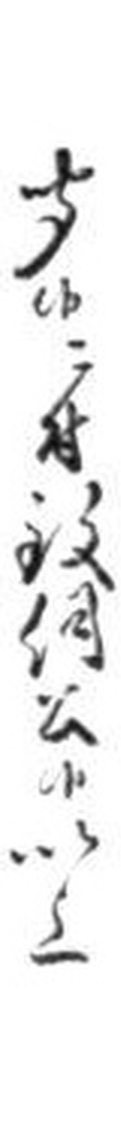聞候ニ付致伺公候以上
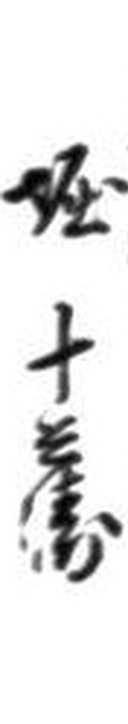堀十兵衛
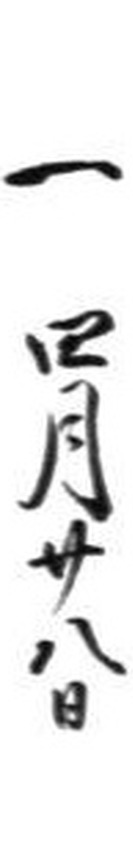一四月廿八日
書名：家譜 二十二 吉品公 従元禄十五年到同十六年
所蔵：福井県文書館 Fukui Prefectural Archives
